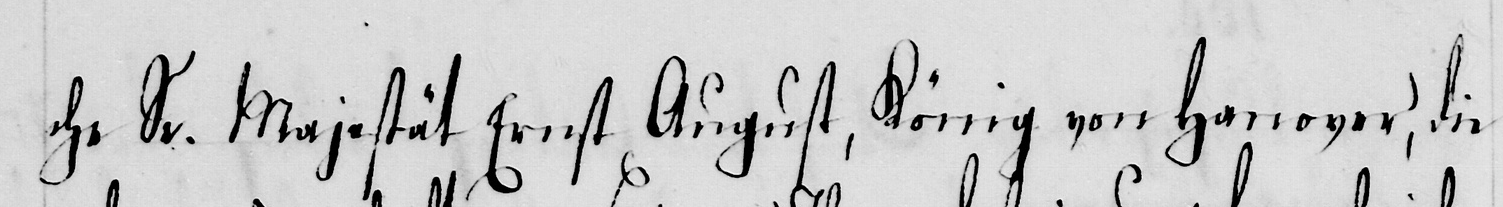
che Se. Majestät Ernst August, König von Hannover, die
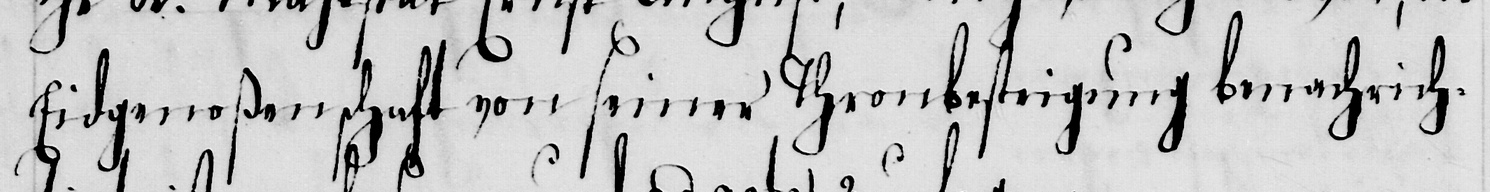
Eidgenoßenschaft von seiner Thronbesteigung benachrich¬
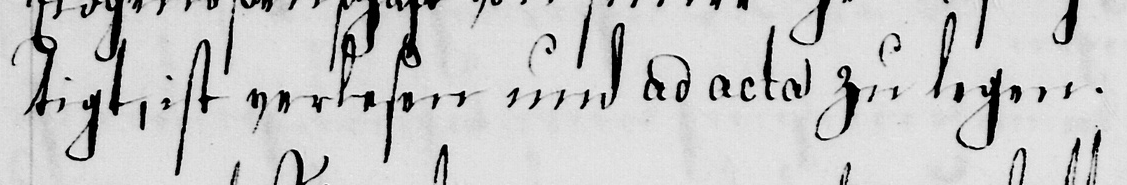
tigt; ist verlesen und ad acta zu legen.
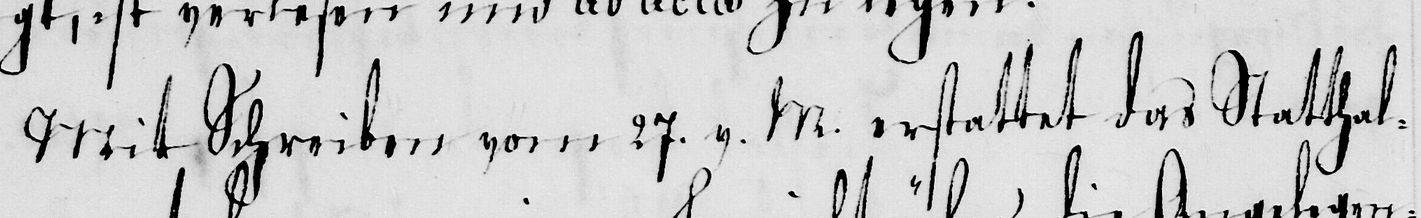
Mit Schreiben vom 27. v. M. erstattet das Statthal¬
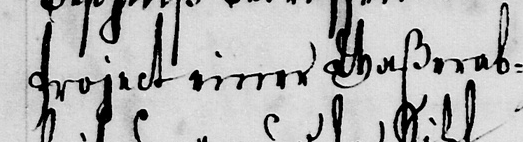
Projectes einer Waßerab¬
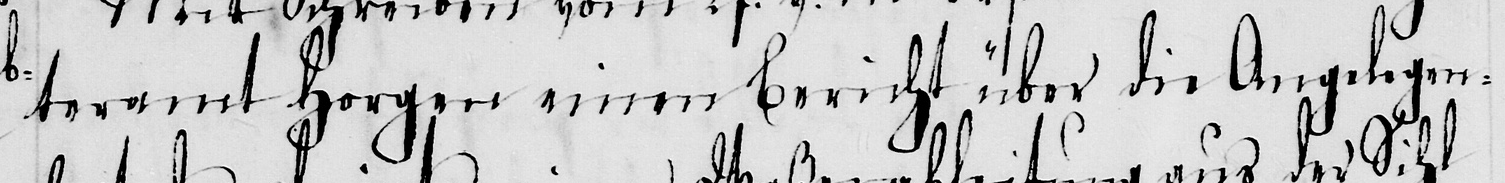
teramt Horgen einen Bericht über die Angelegen¬
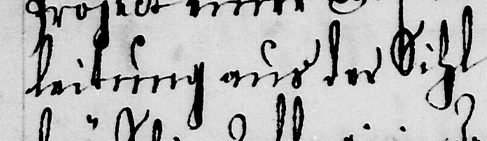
leitung aus der Sihl
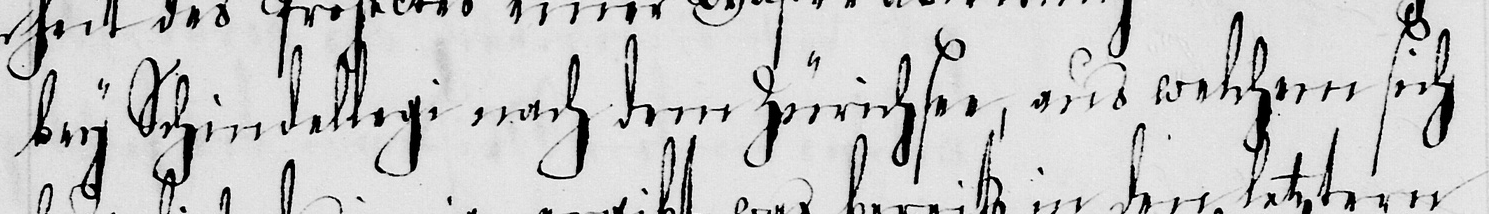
bey Schindellegi nach dem Zürichsee, aus welchem sich
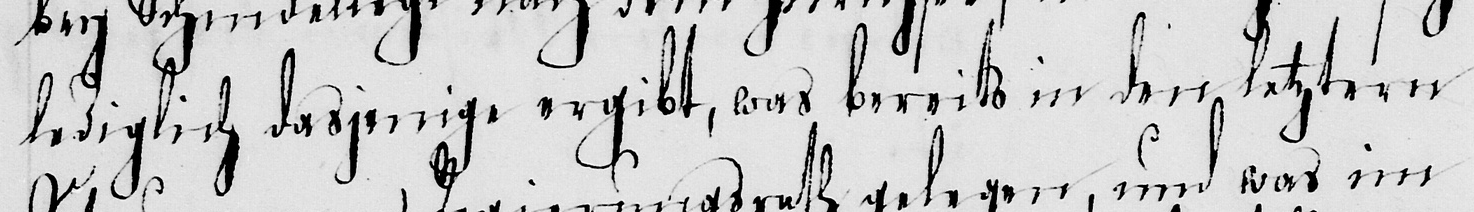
lediglich dasjenige ergibt, was bereits in den letztern
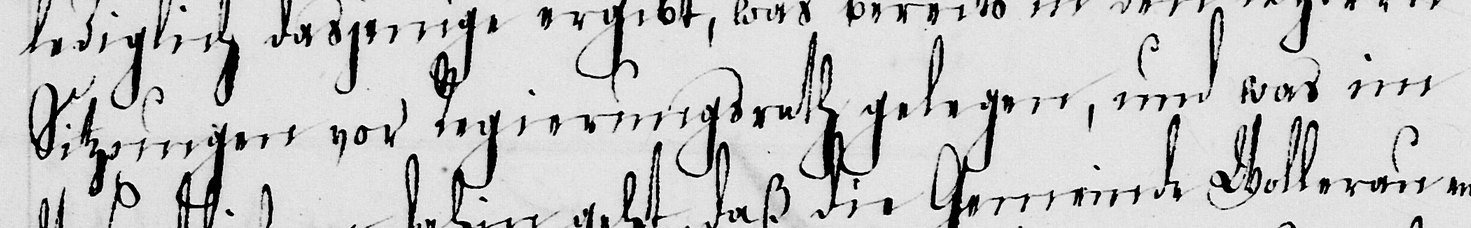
Sitzungen vor Regierungsrath gelegen, und was im
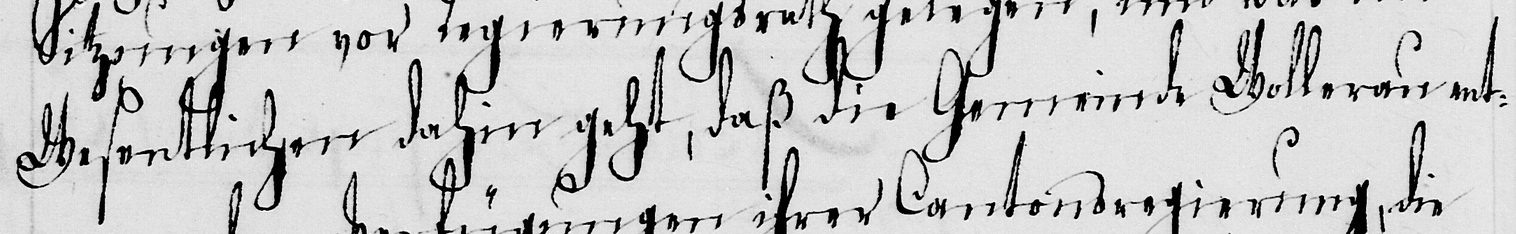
Wesentlichen dahin geht, daß die Gemeinde Wollerau en¬
